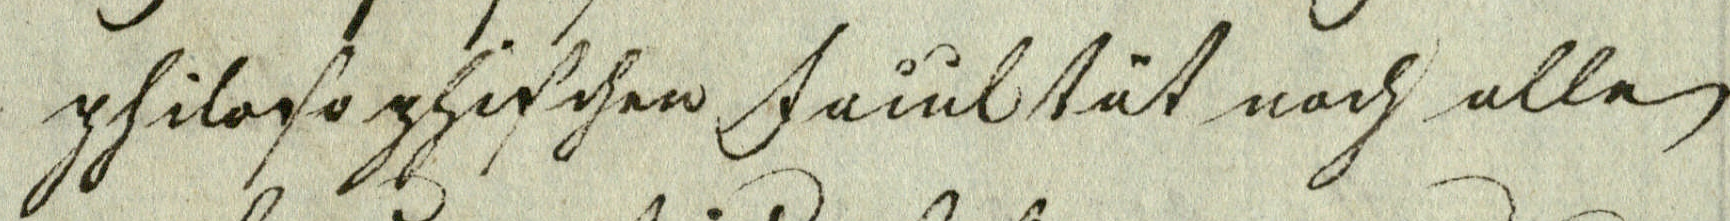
philosophischen Facultät noch alle
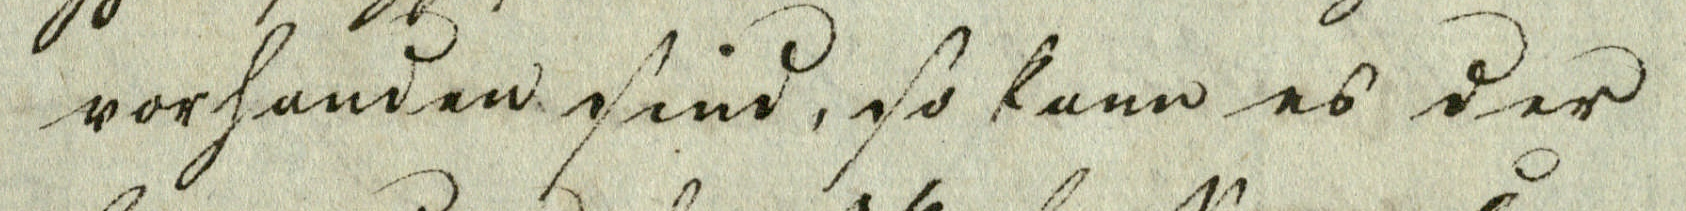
vorhanden sind, so kann es der
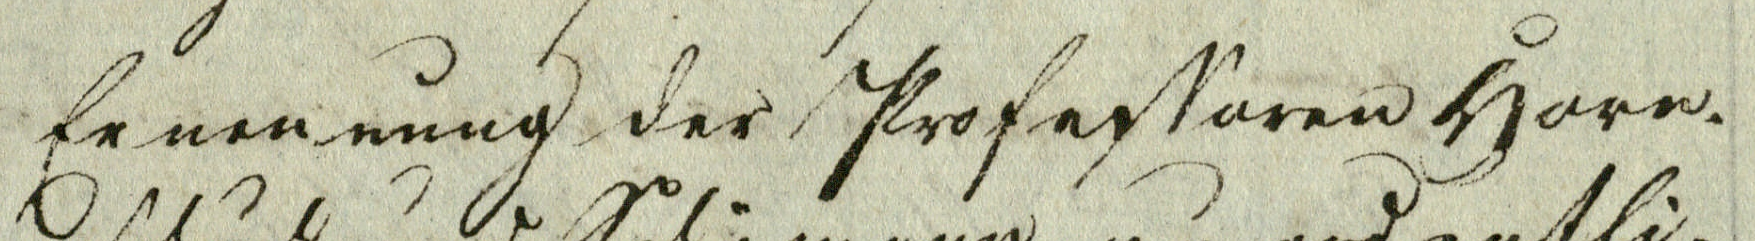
Ernennung der Professoren Horn¬
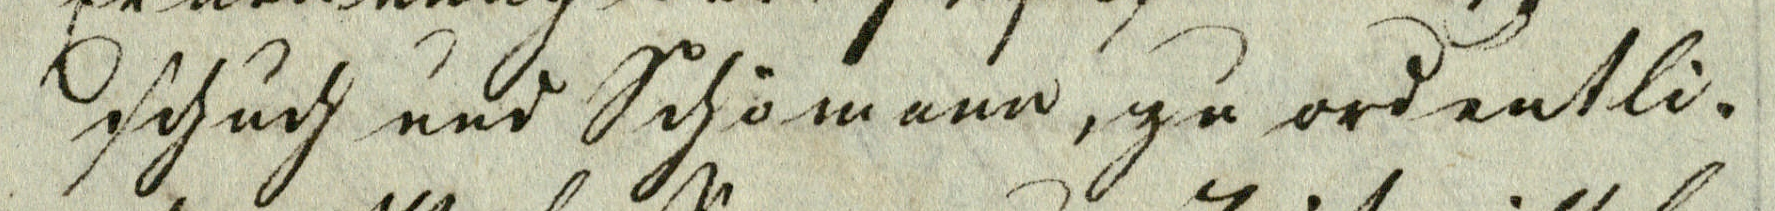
schuch und Schömann, zu ordentli¬
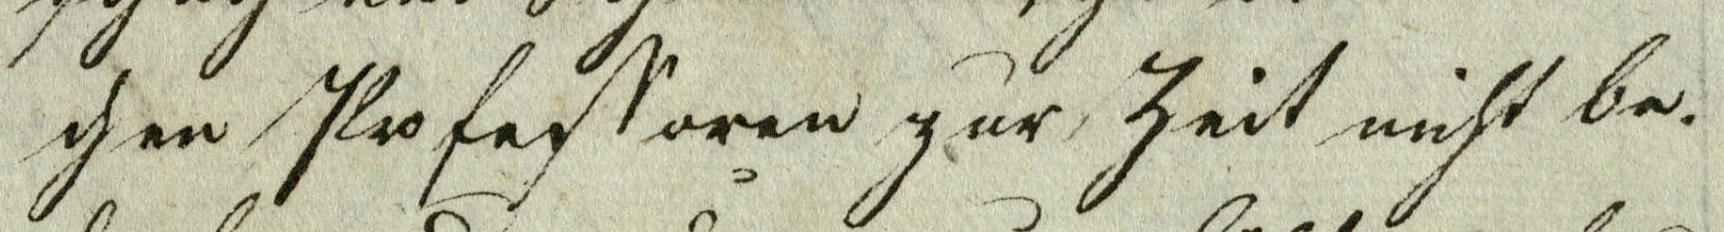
chen Professoren zur Zeit nicht be¬
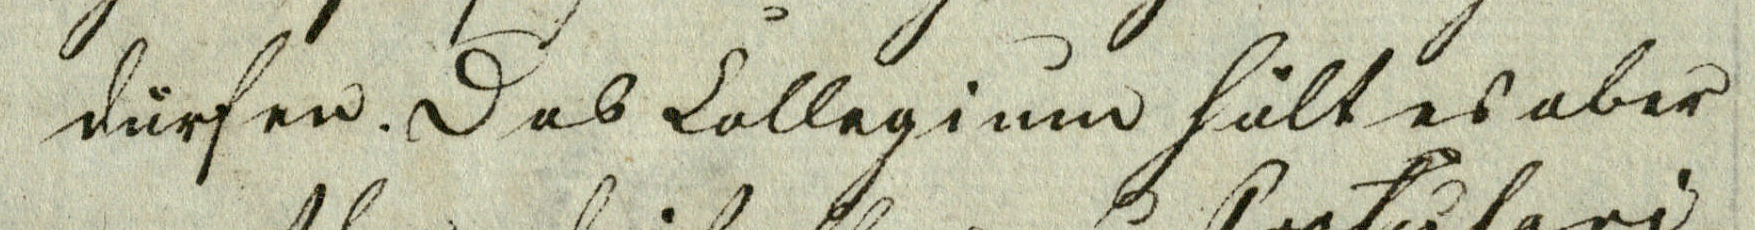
dürfen. Das Collegium hält es aber
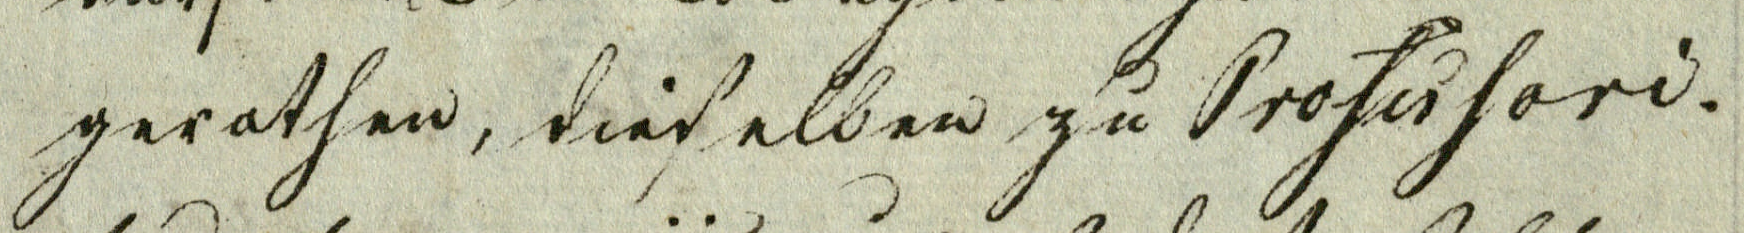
gerathen, dieselben zu Professori¬
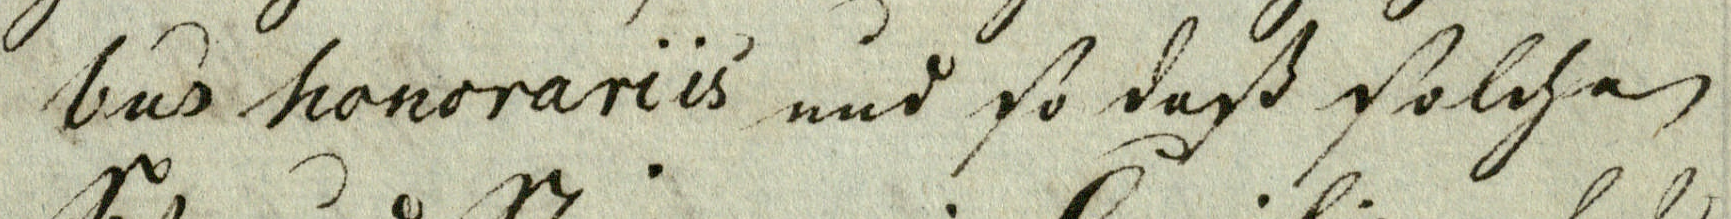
bus honorariis und so daß solche
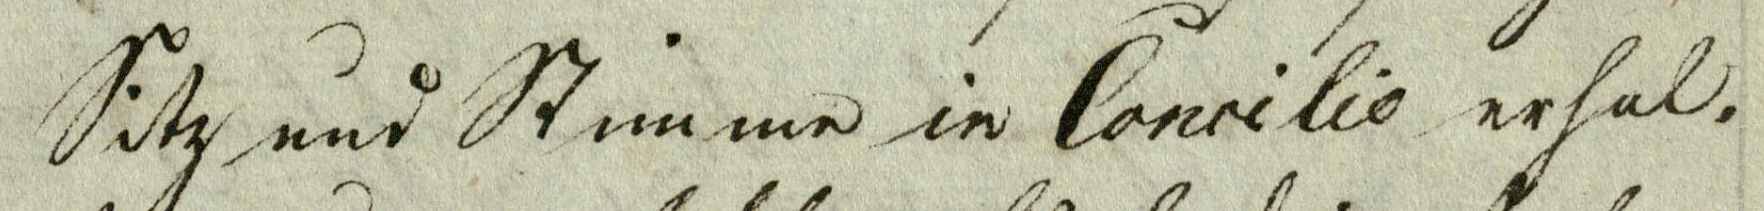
Sitz und Stimme in Concilio erhal¬
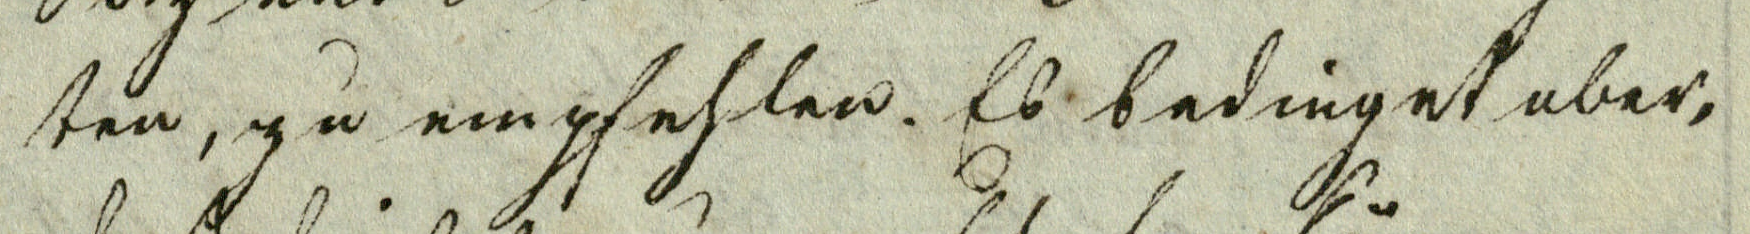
ten, zu empfehlen. Es bedinget aber,
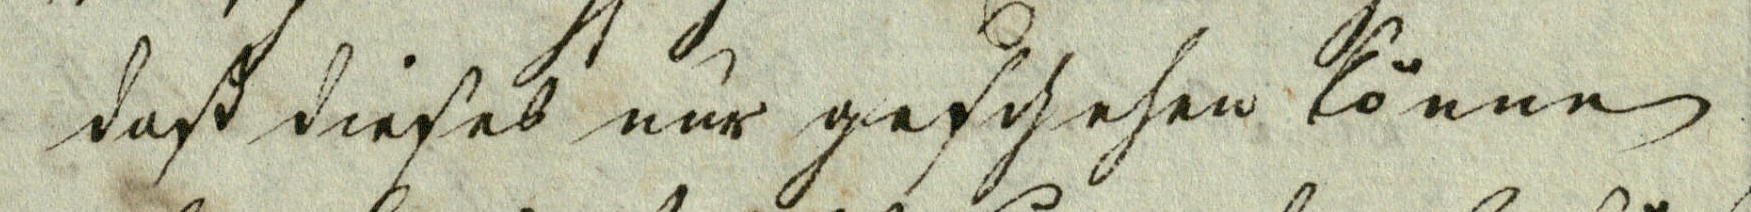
daß dieses nur geschehen könne
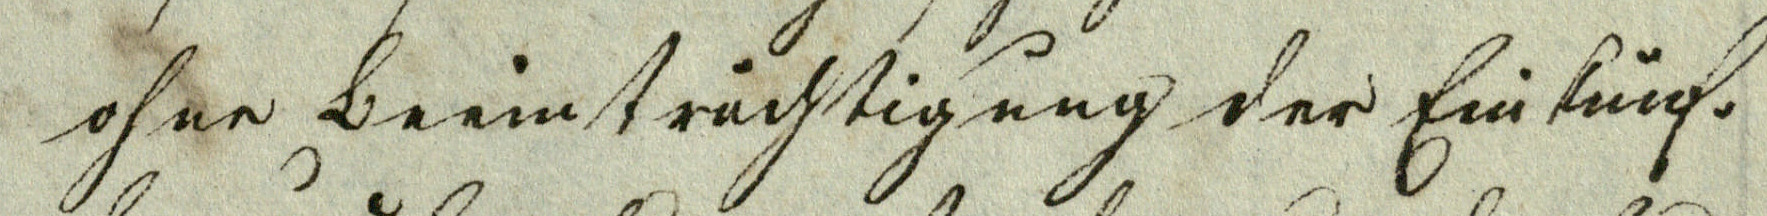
ohne Beeinträchtigung der Einkünf¬
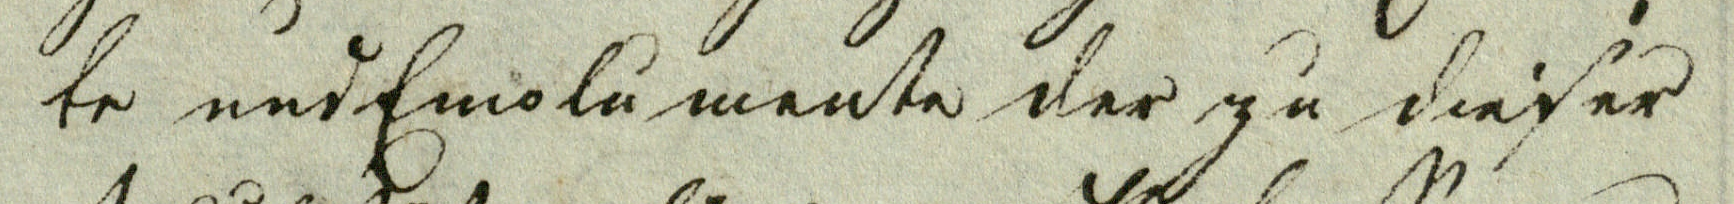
te und Emolumente der zu dieser
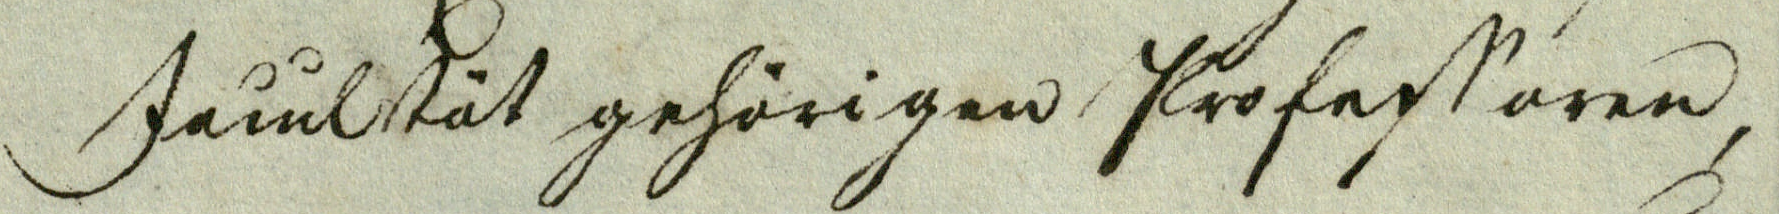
Facultät gehörigen Professoren,
